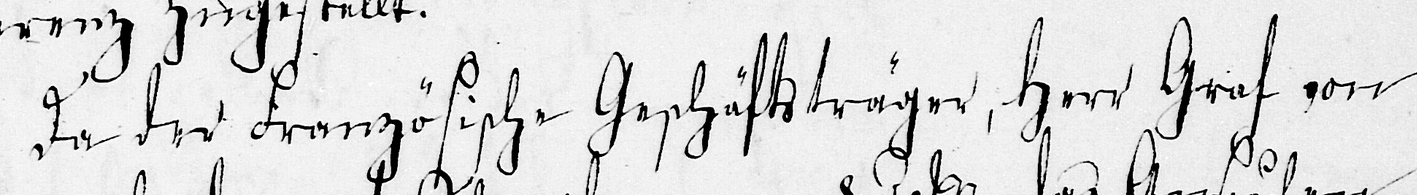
Da der Französische Geschäftsträger, Herr Graf von
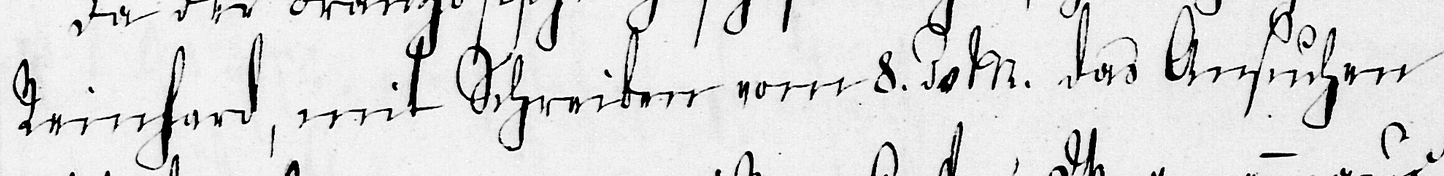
Reinhard, mit Schreiben vom 8. ds M. das Ansuchen
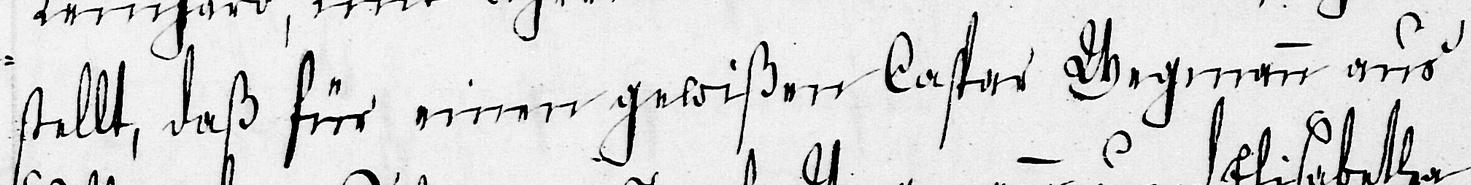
stellt, daß für einen gewißen Caspar Wegmann aus
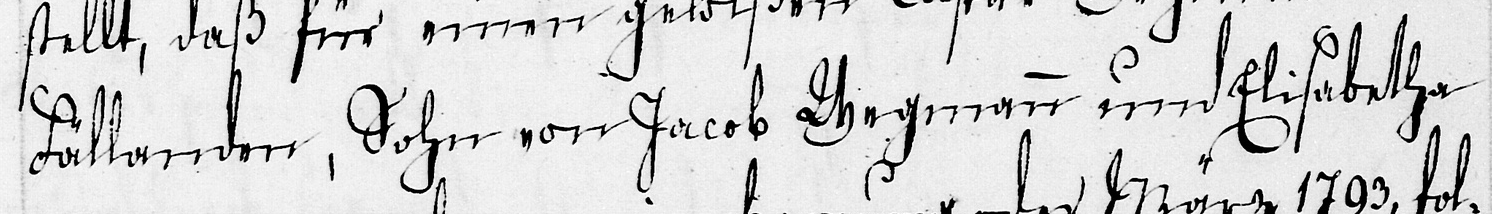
Fällanden, Sohn von Jacob Wegmann und Elisabetha
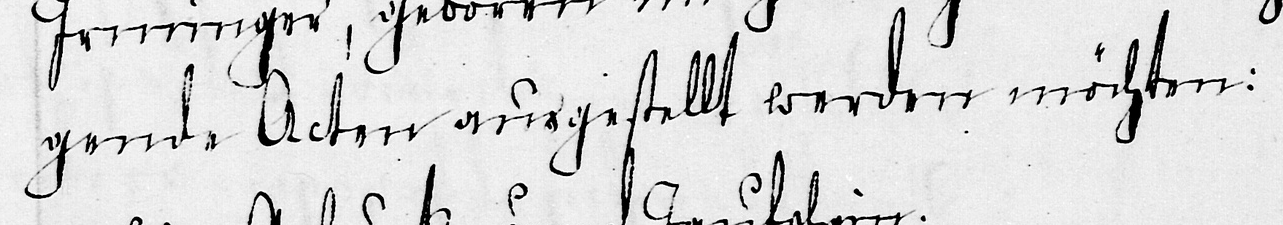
gende Acten ausgestellt werden möchten:
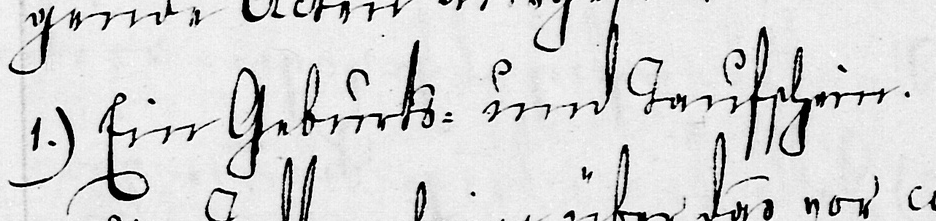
1.) Ein Geburts- und Taufschein.
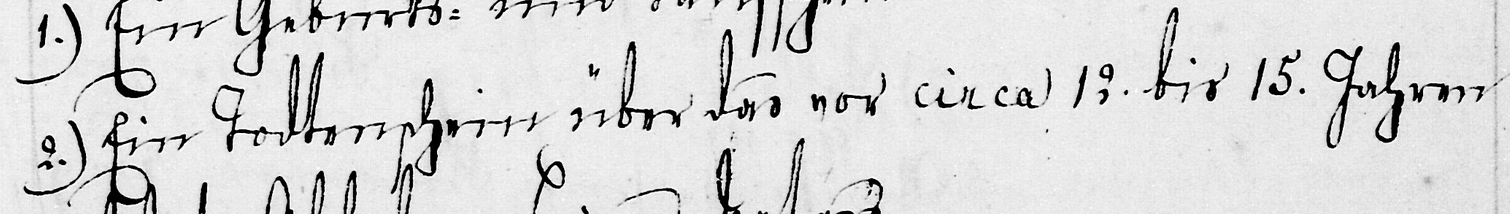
2.) Ein Todtenschein über das vor circa 12. bis 15. Jahren
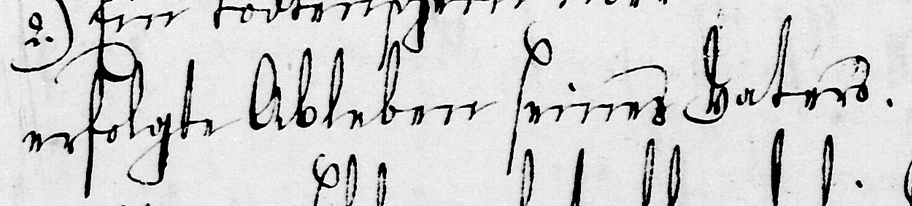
erfolgte Ableben seines Vaters.
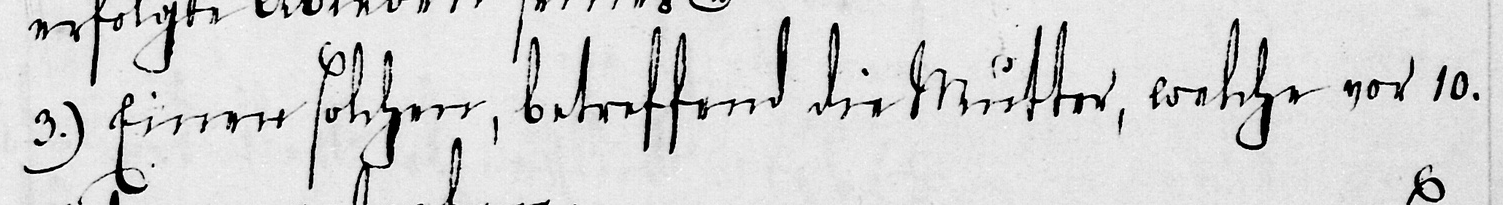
3.) Einen solche, betreffend die Mutter, welche vor 10.
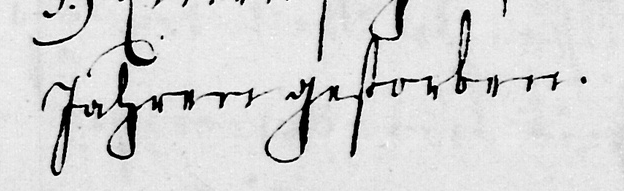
Jahren gestorben.
